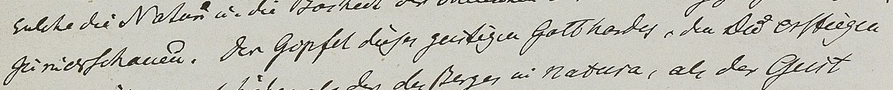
zurückschauen. Der Gipfel dieses geistigen Gotthardes, den Du erstiegen
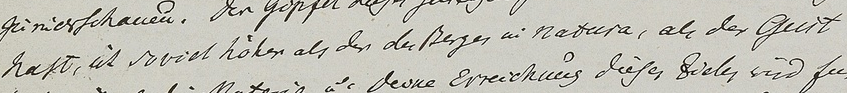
hast, ist so viel höher als der des Berges in Natura, als der Geist
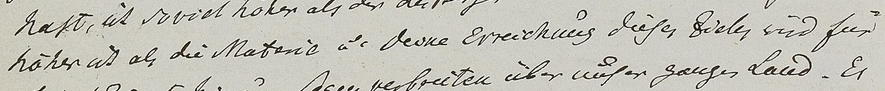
höher ist als die Materie u. Deine Erreichung dieses Zieles wird für
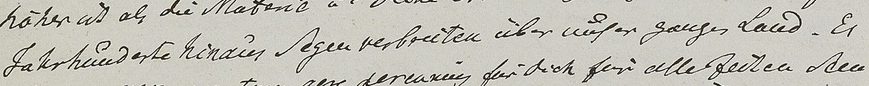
Jahrhunderte hinaus Segen verbreiten über unser ganzes Land. Es
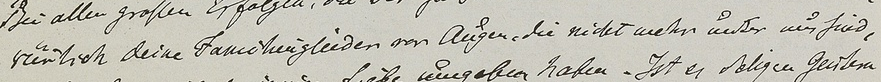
kürlich Deine Familienglieder vor Augen, die nicht mehr unter uns sind,
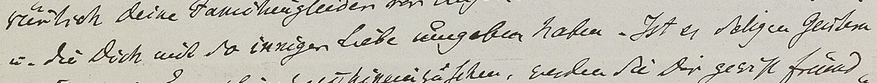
u. die Dich mit so inniger Liebe umgeben haben. Ist es seligen Geistern
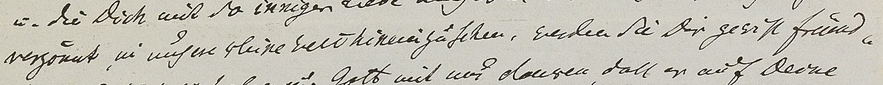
vergönnt, in unsere kleine Welt hineinzusehen, werden sie Dir gewiss freund-
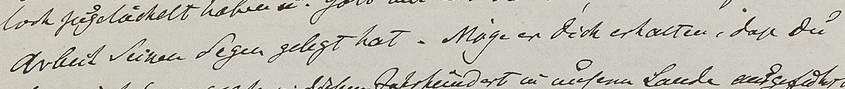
Arbeit seinen Segen gelegt hat. Möge er Dich erhalten, dass Du
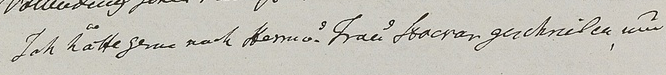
Ich hätte gerne noch Herrn u. Frau Stockar geschrieben, um
